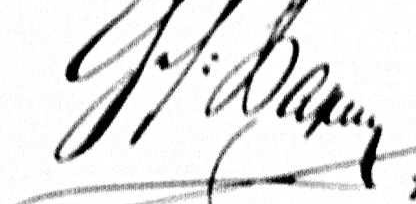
Ges. Basmy
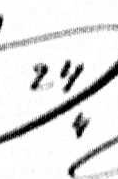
24/4
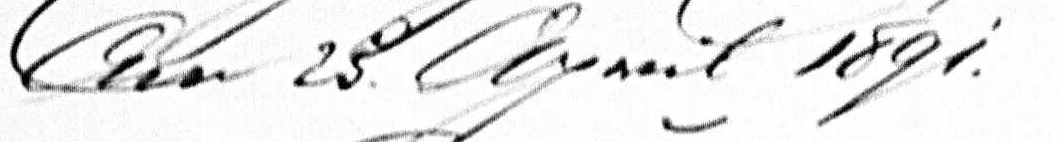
Am 25. April 1891
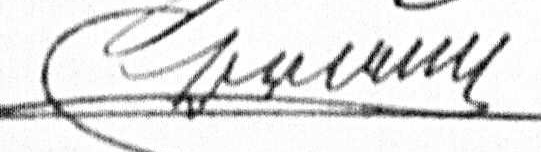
Wraun
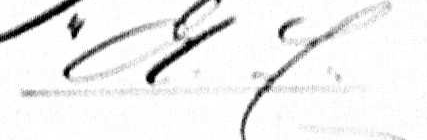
AE
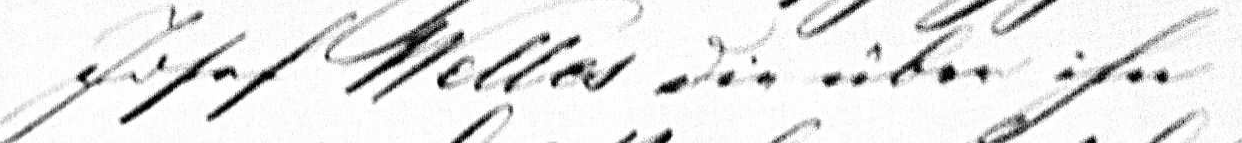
Josef Welles die über ihn
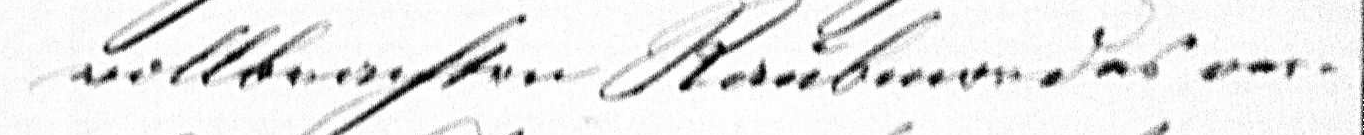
vollbrachten Raubmordes ver¬
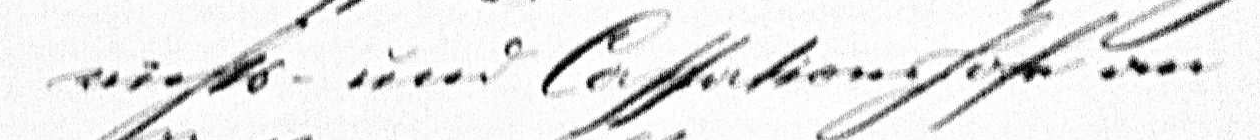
richts- und Cassationshofe, an
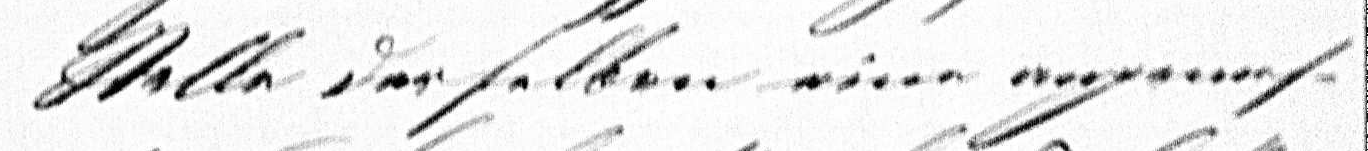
Stelle derselben eine angemes¬
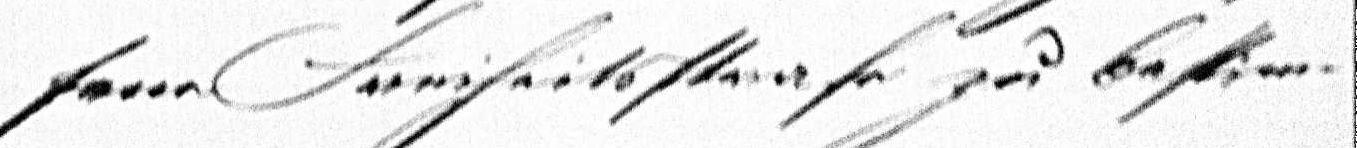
sene Freiheitsstrafe zu bestim¬
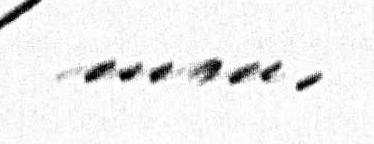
men.
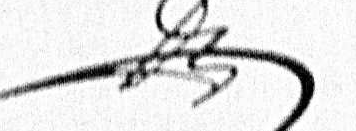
FJ
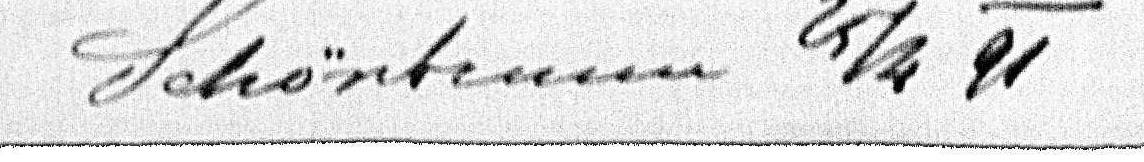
Schönbrunn 25/4/1891
